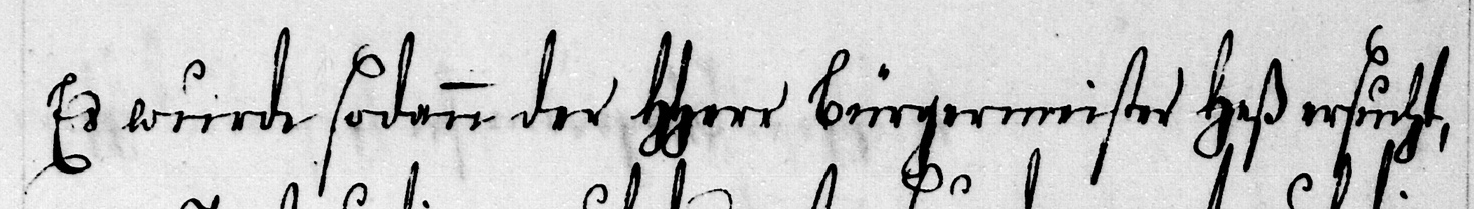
Es wurde sodann der HHerr Bürgermeister Heß ersucht,
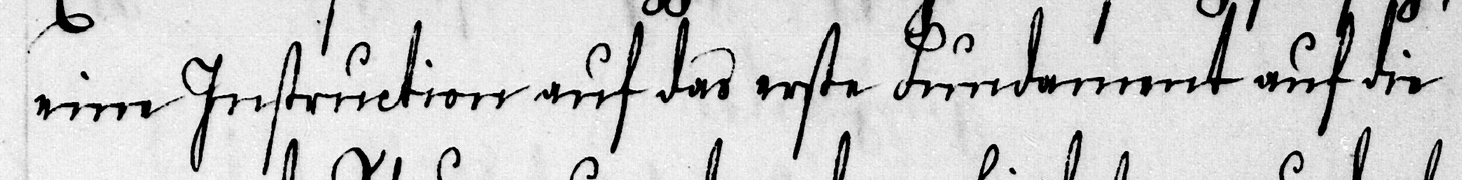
eine Instruction auf das erste Fundament auf die
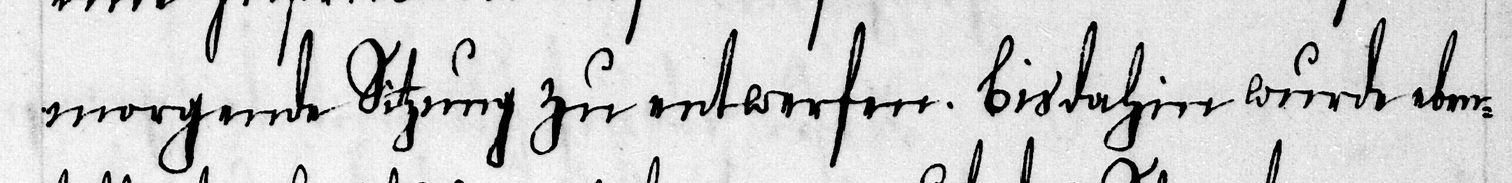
morgende Sitzung zu entwerfen. Bis dahin wurde ebe¬
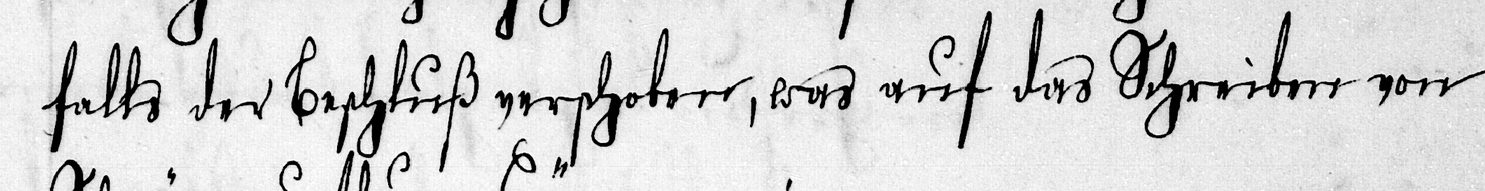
nfalls der Beschluß verschoben, was auf das Schreiben von
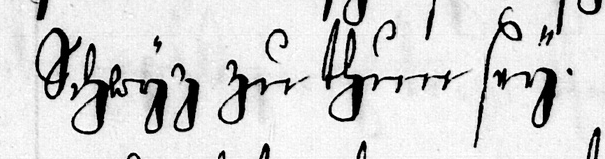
Schwyz zu thun sey.
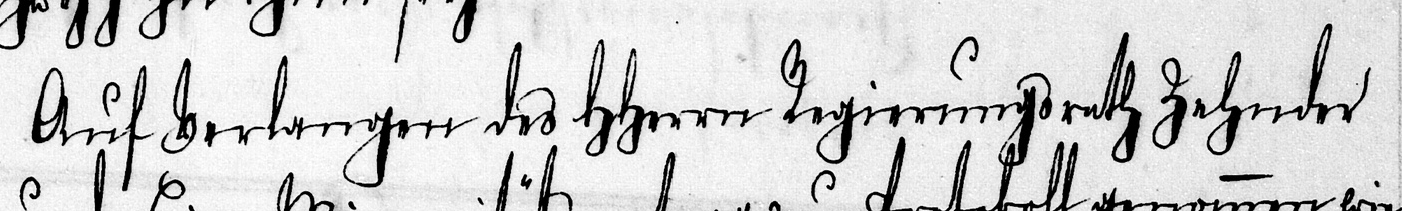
Auf Verlangen des HHerrn Regierungsrath Zehnder
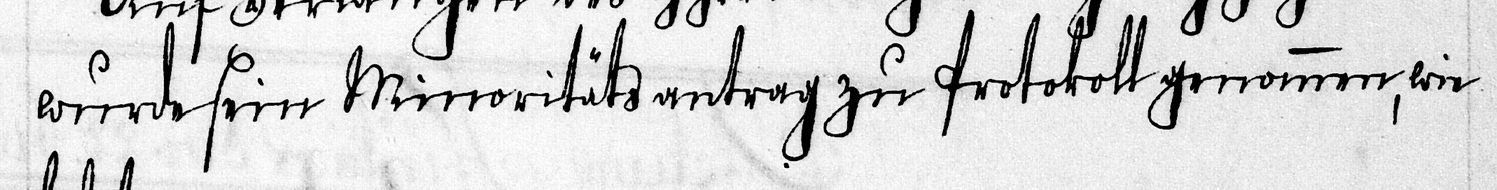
wurde sein Minoritätsantrag zu Protokoll genommen, wie
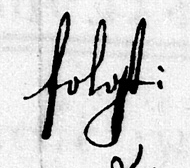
folgt:
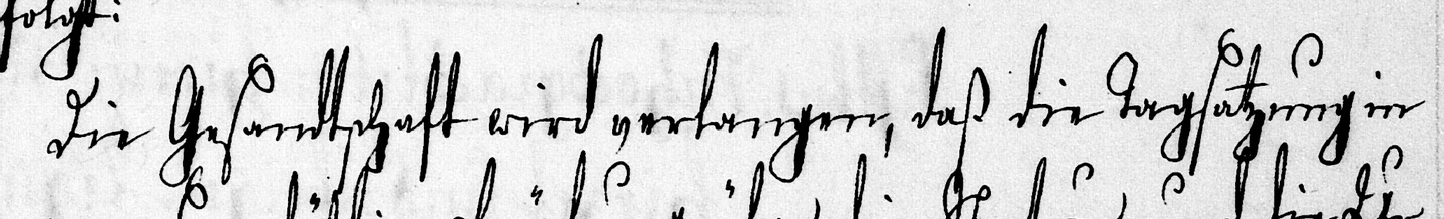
Die Gesandtschaft wird verlangen, daß die Tagsatzung in
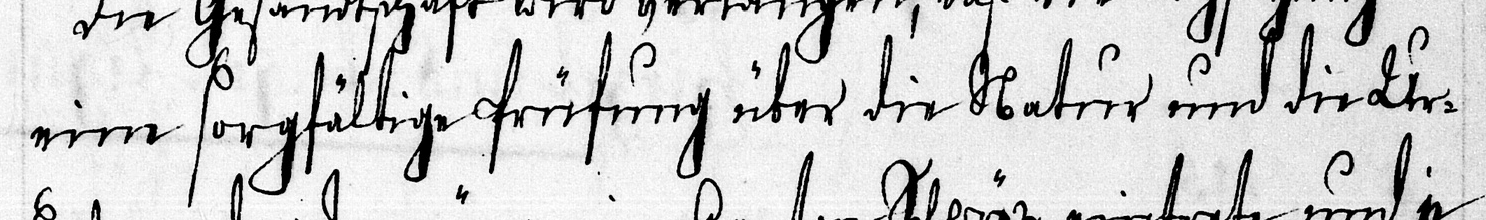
eine sorgfältige Prüfung über die Natur und die Ur¬
